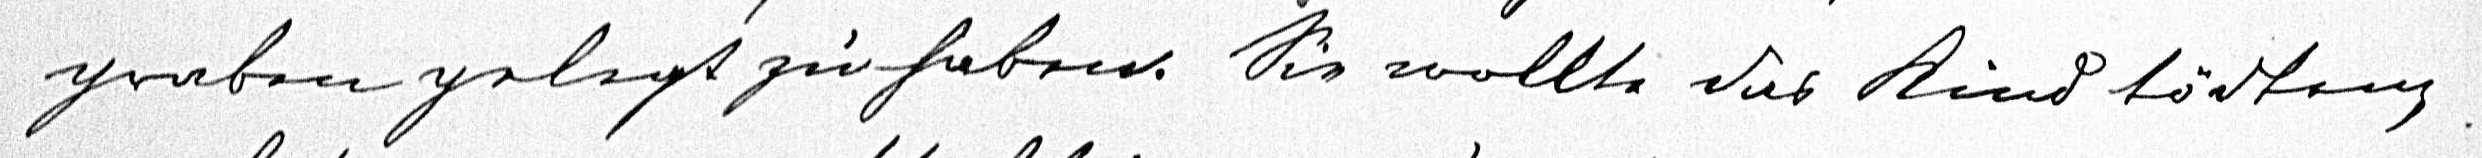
graben gelegt zu haben. Sie wollte das Kind tödten,
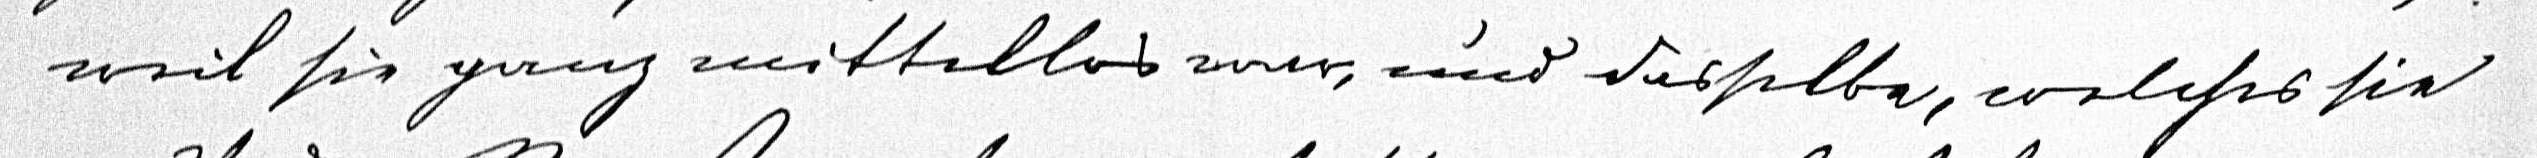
weil sie ganz mittellos war, und dasselbe, welches sie
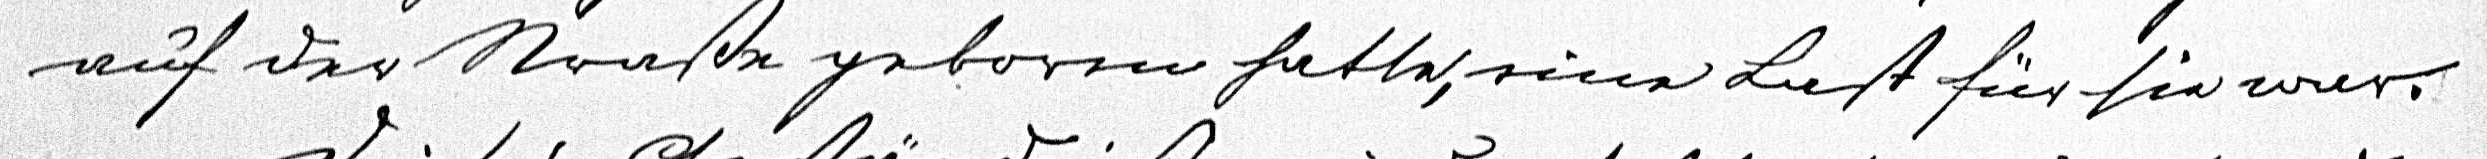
auf der Straße geboren hatte, eine Last für sie war.
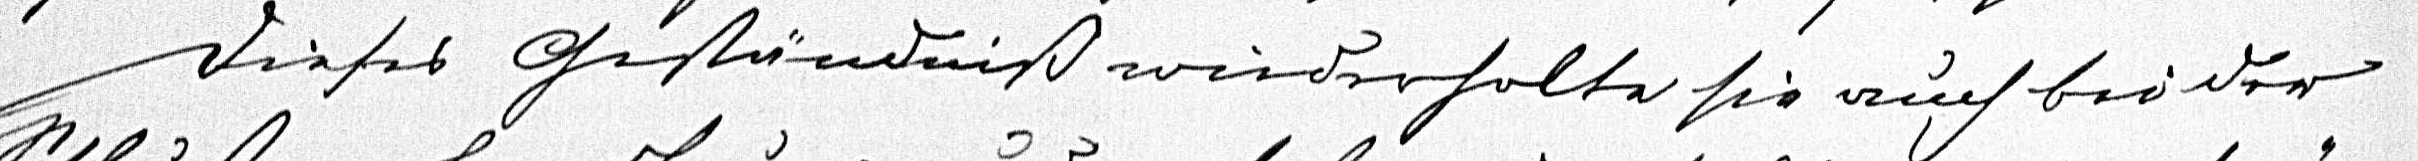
Dieses Geständniß wiederholte sie auch bei der
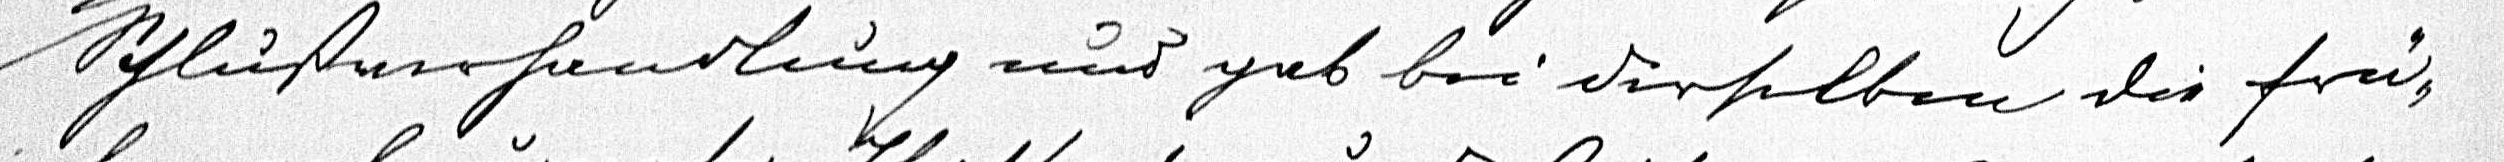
Schlußverhandlung und gab bei derselben die frü¬
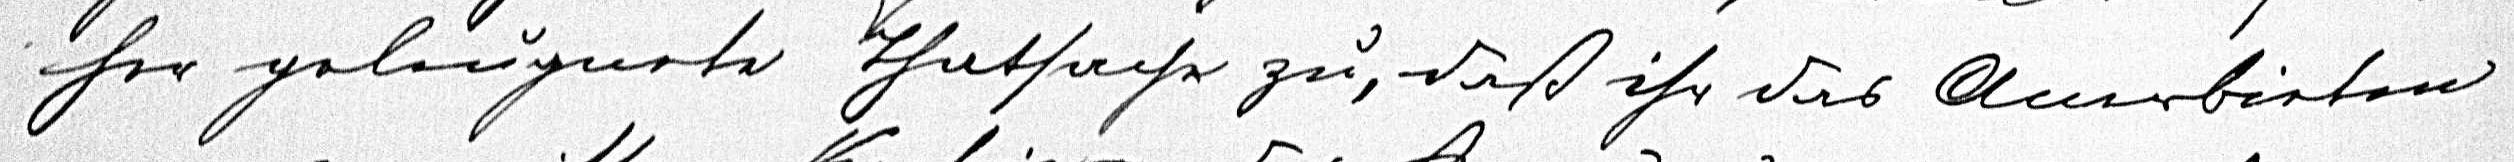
her geleugnete Thatsache zu, daß ihr das Anerbieten
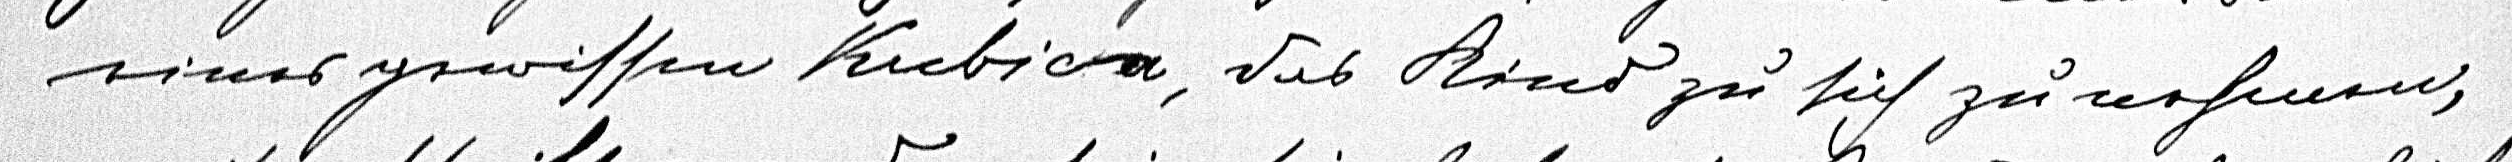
eines gewissen Kubica, das Kind zu sich zu nehmen,
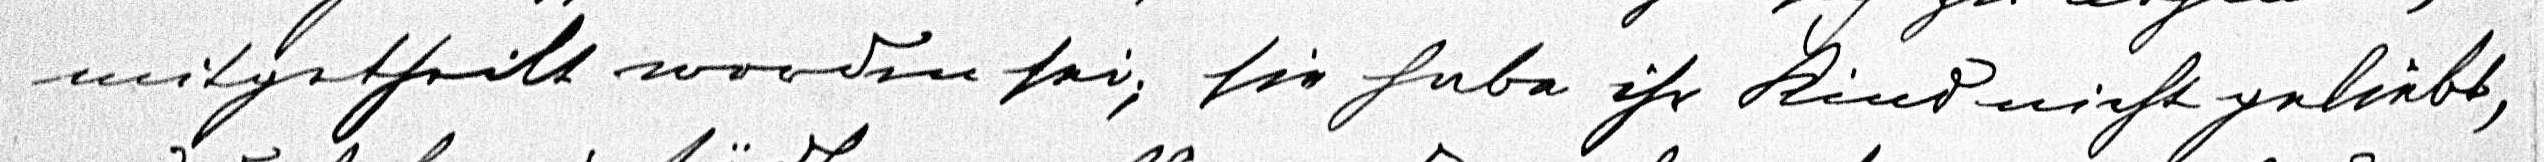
mitgetheilt werden sei; sie habe ihr Kind nicht geliebt,
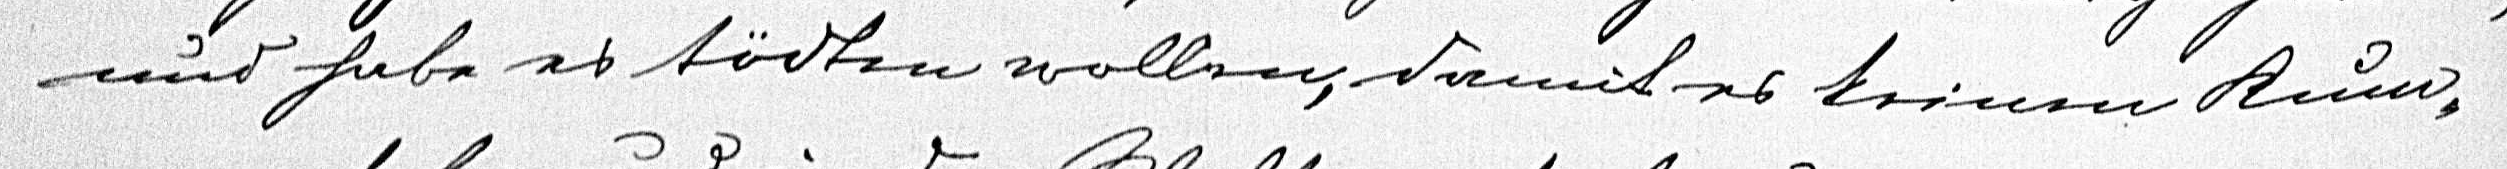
und habe es tödten wollen, damit es keinen Kum¬
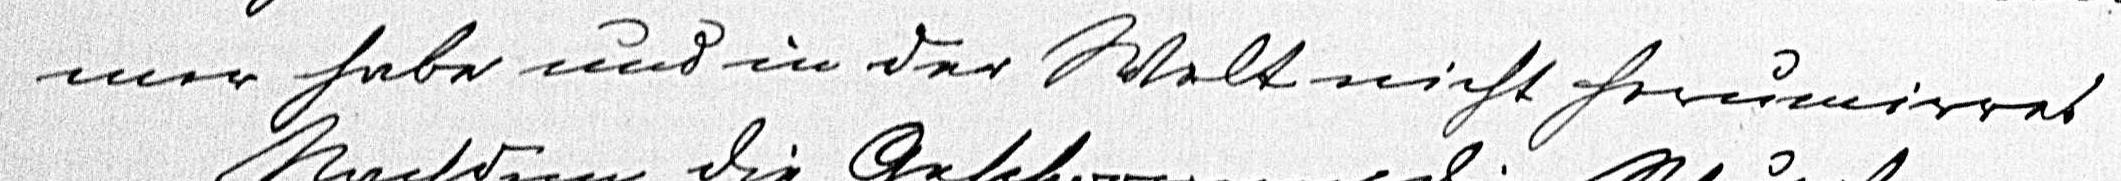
mer habe und in der Welt nicht herumirre.
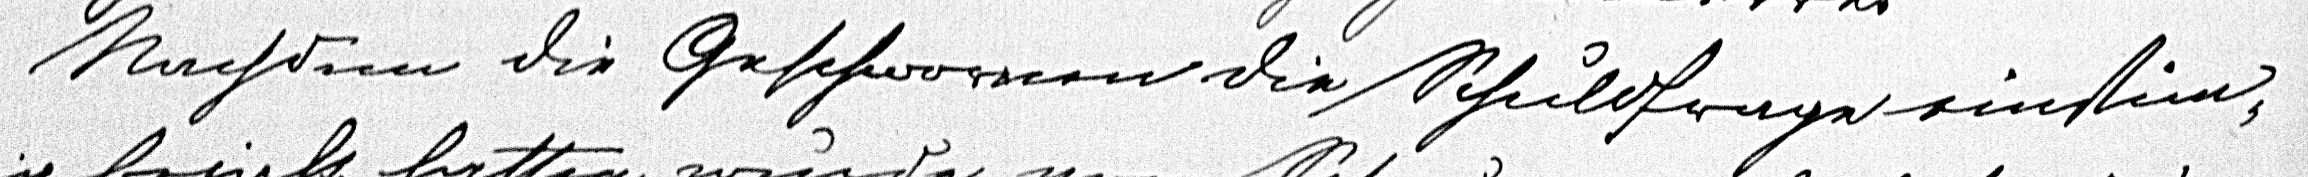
Nachdem die Geschworenen die Schuldfrage einstim¬
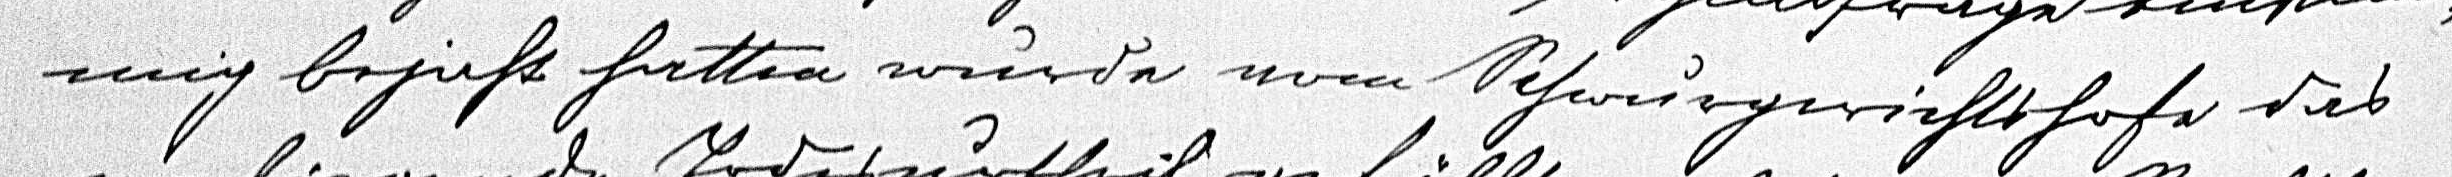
mig bejaht hatten wurde vom Schurgerichtshofe des
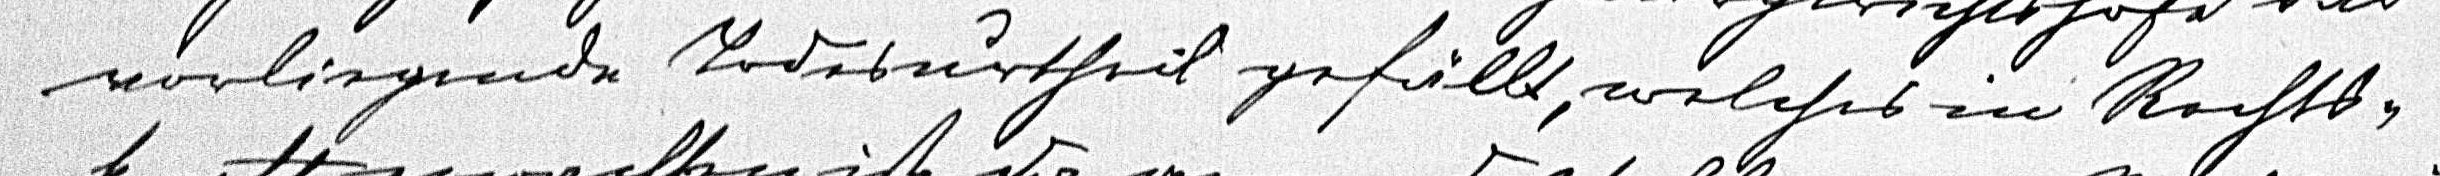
vorliegende Todesurtheil gefällt, welches in Recht¬
